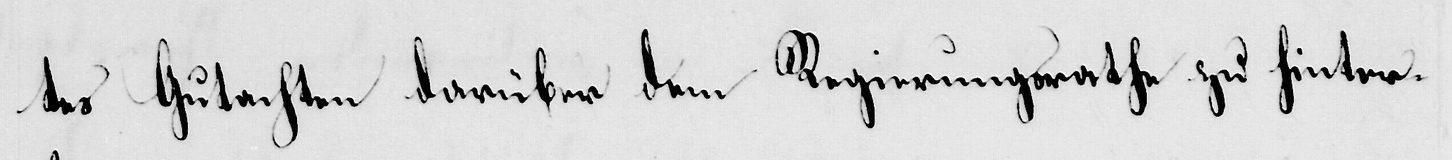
tes Gutachten darüber dem Regierungsrathe zu hinter¬
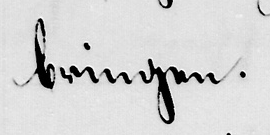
bringen.
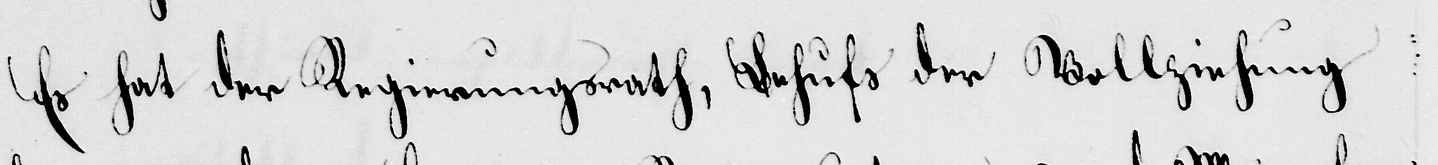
Es hat der Regierungsrath, Behufs der Vollziehung
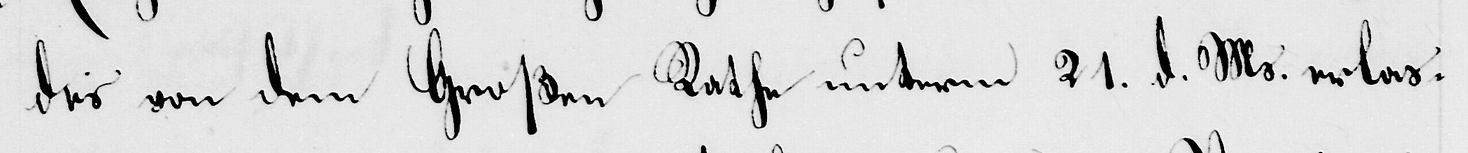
des von dem Großen Rathe unterm 21. d. Ms. erlas¬
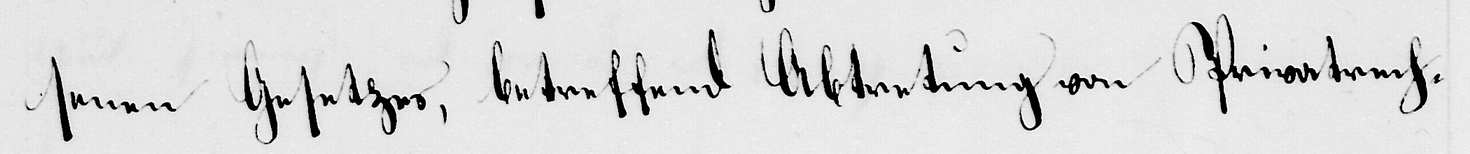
senen Gesetzes, betreffend Abtretung von Privatrech¬
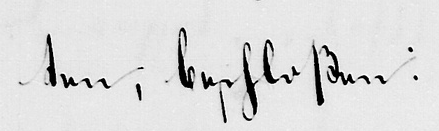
ten, beschloßen:
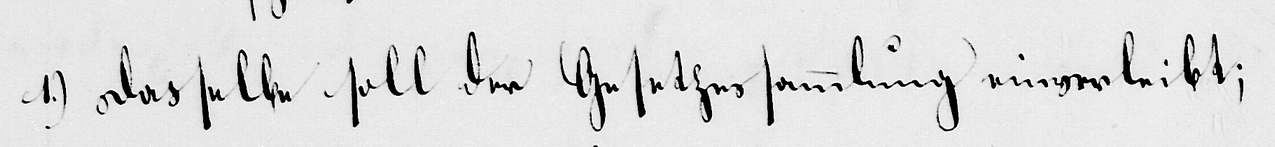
1.) Dasselbe soll der Gesetzessammlung einverleibt;
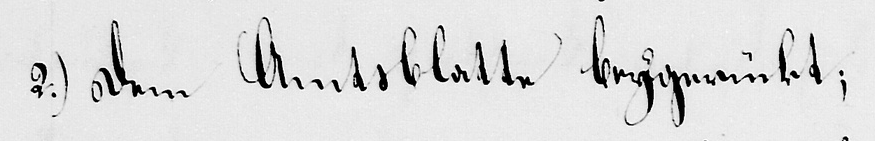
2.) Dem Amtsblatte beygerückt;
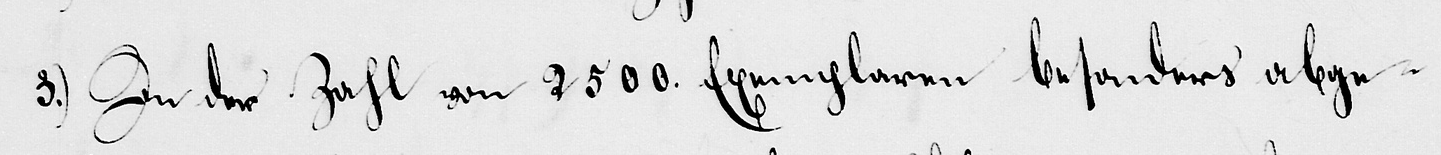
3.) In der Zahl von 2500. Exemplaren besonders abge¬
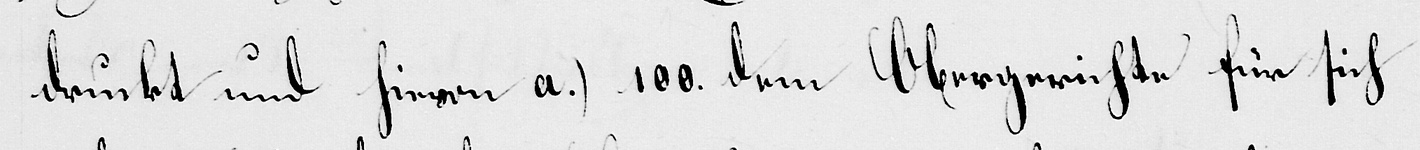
druckt und hievon a.) 100. dem Obergerichte für sich
